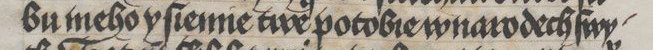bu meho y ſiemie twe potobie wnarodech ſwy¬
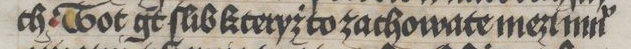ch Tot ḡt ſlib kteryż to zachowate mezi mnv
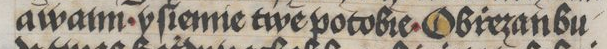a wami.y ſíemie twe potobie.Obṙezan bu¬
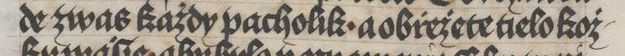de zwas każdy pacholik.a obṙeżete tielo koż¬
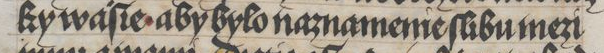ky waẛie.aby bylo naznameníe ſlibu mezi
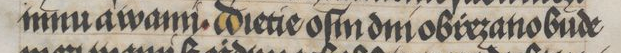minu a wami.Dietie oſm dní obṙezano bude
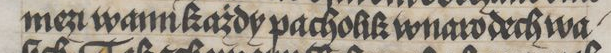mezi wami każdy pacholik wnarodech wa¬
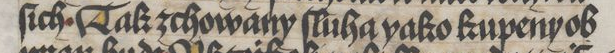ẛich.Tak zchowany ſluha yako kupeny ob¬
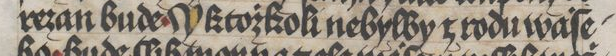rezan bude.Y ktożkoli nebylby z rodu waẛe¬
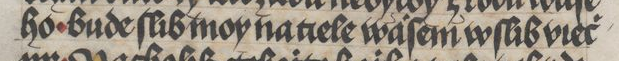ho.bude ſlib moy na tiele waẛem w ſlib vieč¬
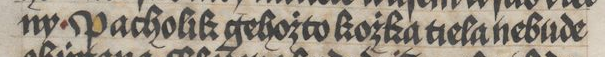ny.Pacholik gehożto kożka tiela nebude
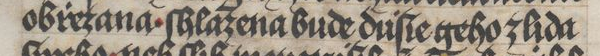obṙeżana.ſhlazena bude duẛie geho z lida
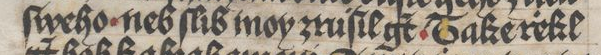ſweho.neb ſlib moy zruẛil ḡt.Take ṙekl
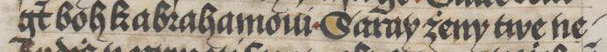ḡt boh k abrahamoui.Saray żeny twe ne¬
